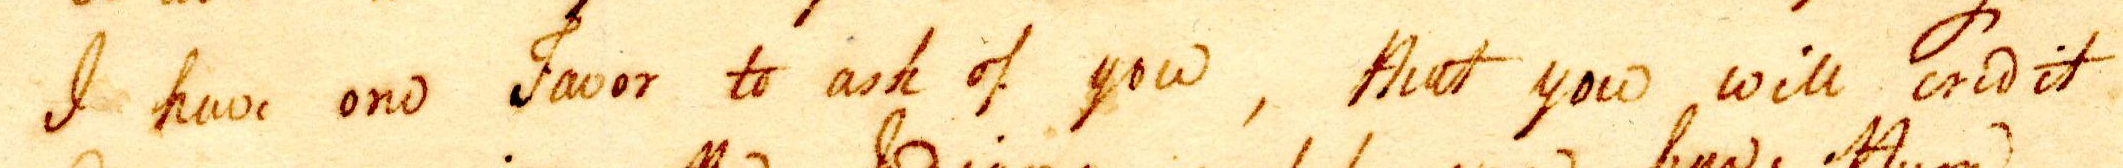I have one Favor to ask of you, that you will credit
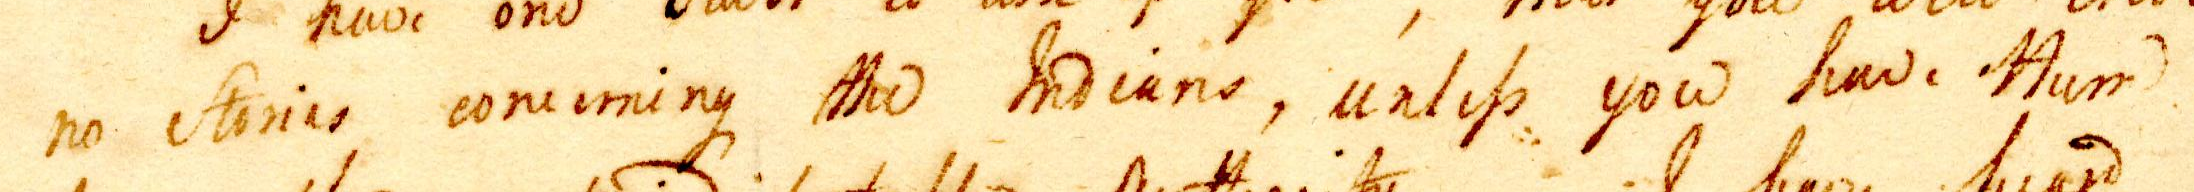no Stories concerning the Indians, unless you have them
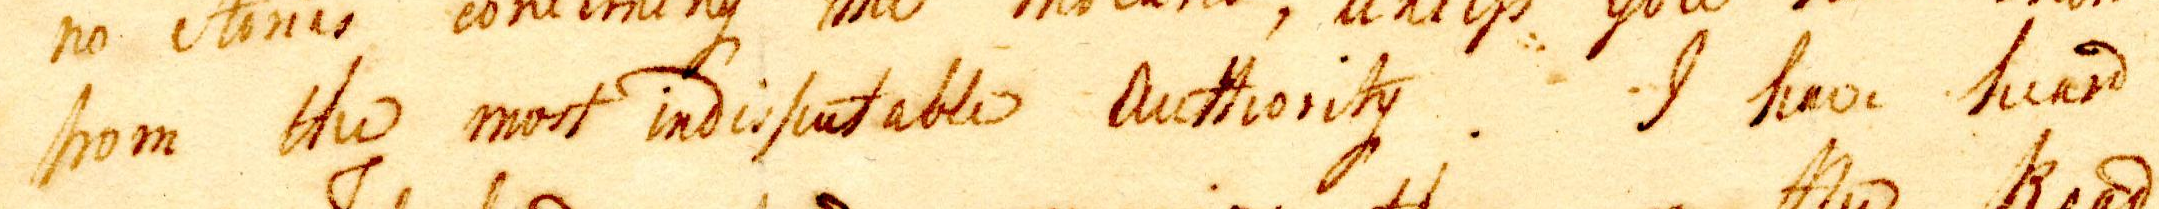from the most indisputable Authority. I have heard
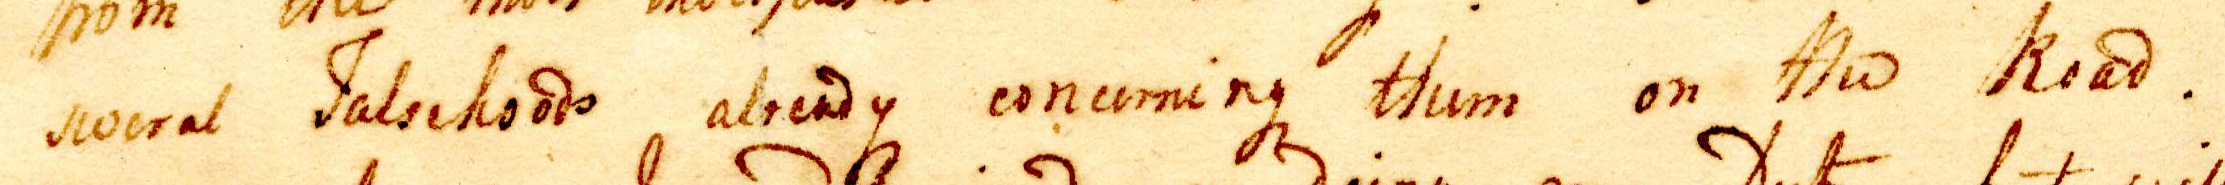several Falsehoods already concerning them on the Road.
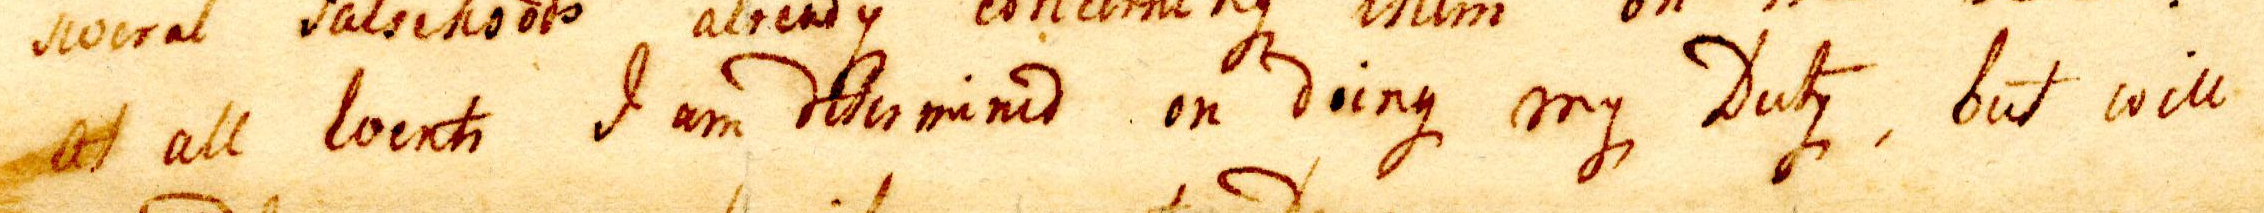At all Events I am determined on doing my Duty, but will
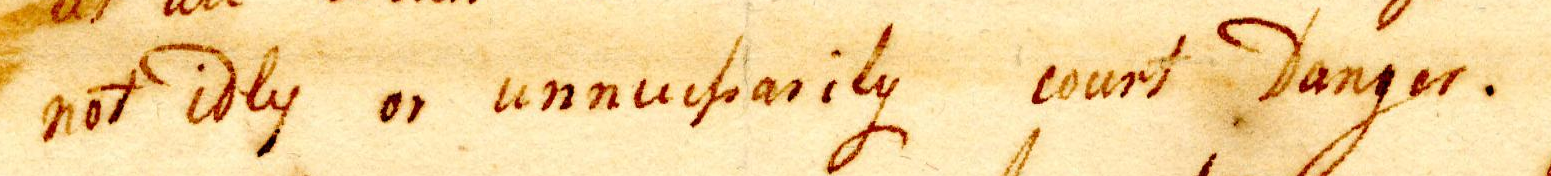not idly or unnecessarily court Danger.
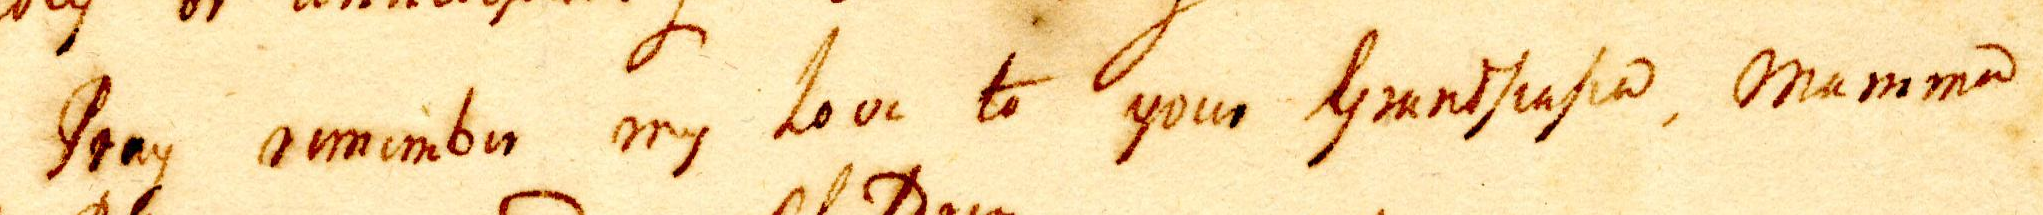Pray remember my Love to your Grandpapa, Mamma
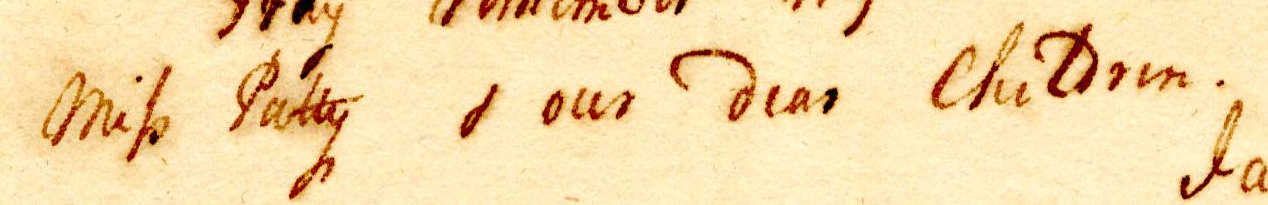Miss Patty & our dear Children.
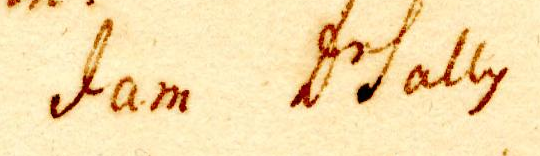I am D^r Sally
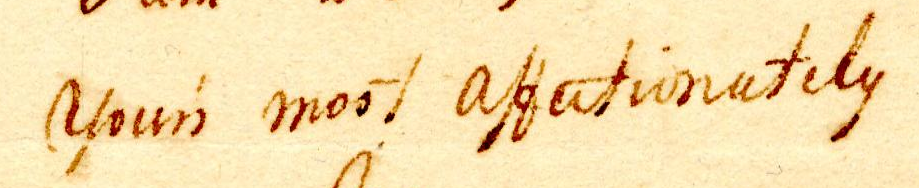Your's most affectionately
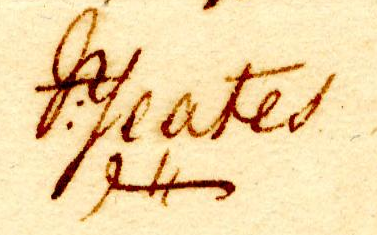J: Yeates
